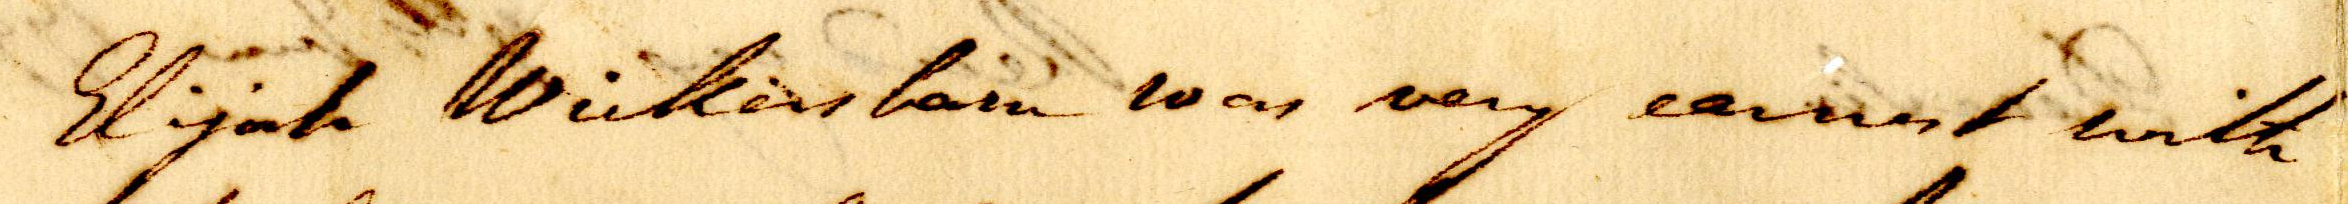Eljah Wickersham was very earnest with
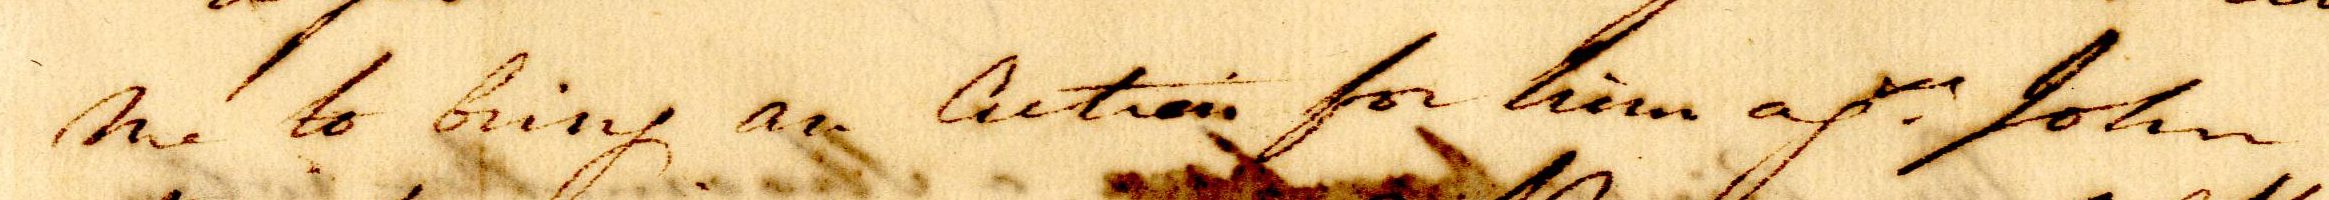me to bring an Action for him ag^t. John
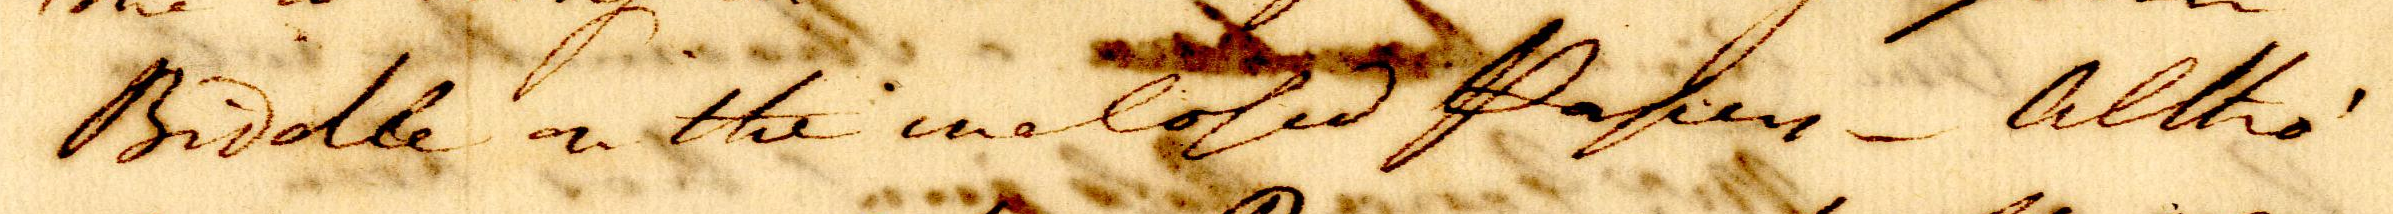Biddle on the inclosed Papers, Altho'
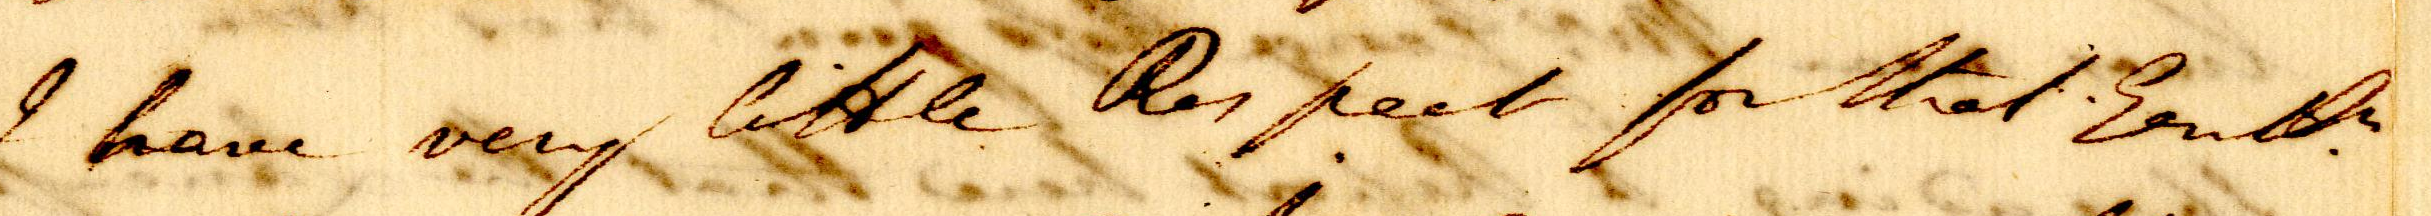I have very little Respect for that Gentle^n.
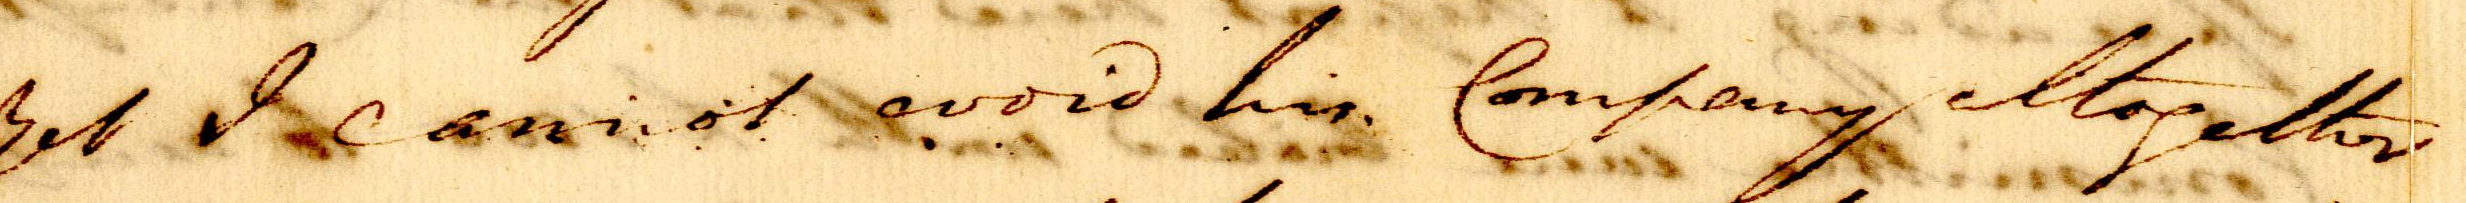yet I cannot avoid his Company altogether
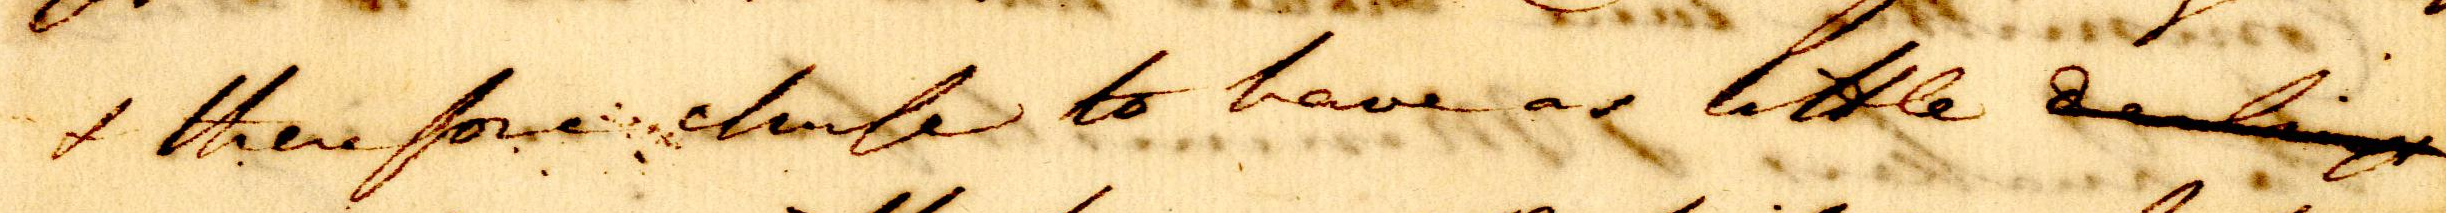& therefore chuse to have as little dealings
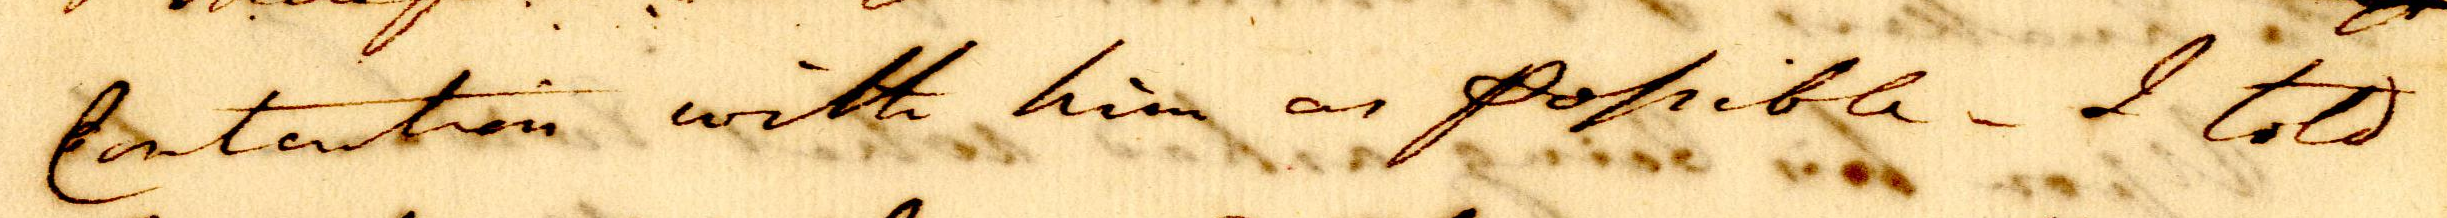Contention with him as possible. I told
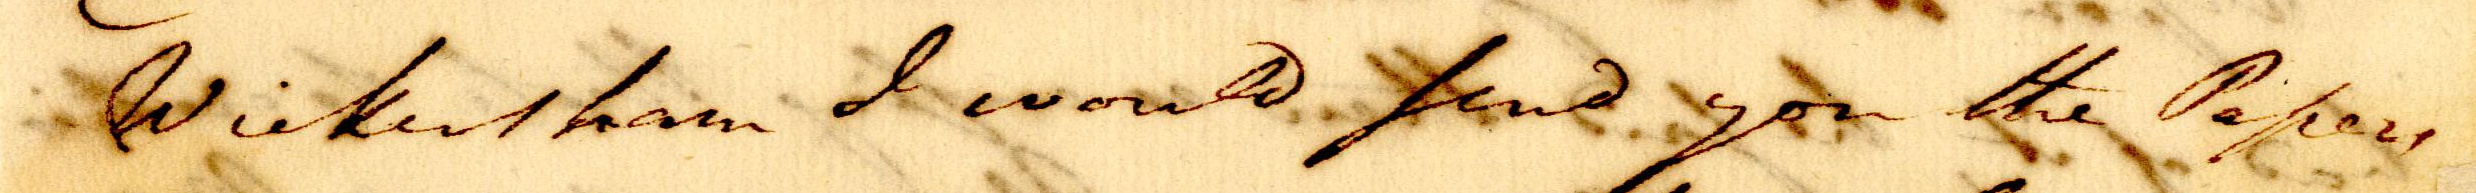Wickersham I would send you the Papers
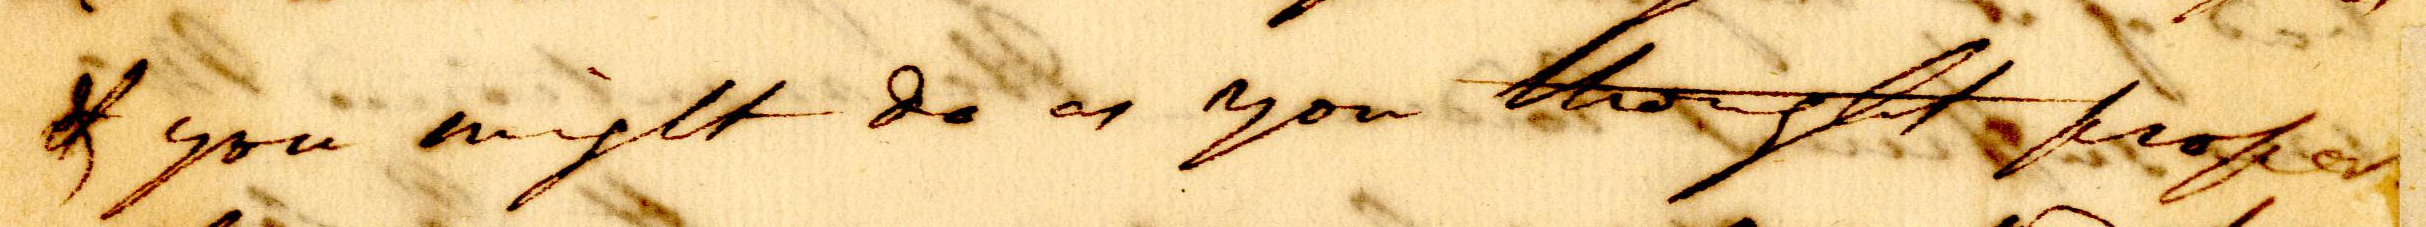& you might do as you thought proper
